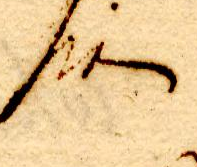Sir
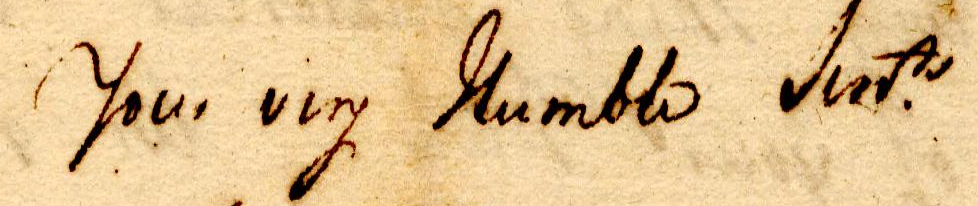Your very Humble Serv^t.
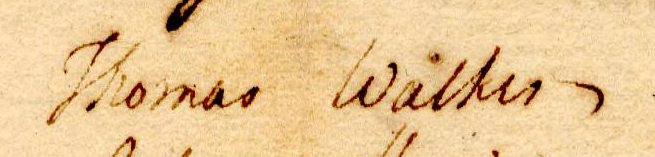Thomas Walker
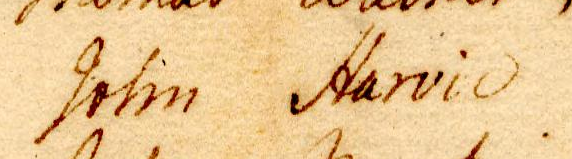John Harvie
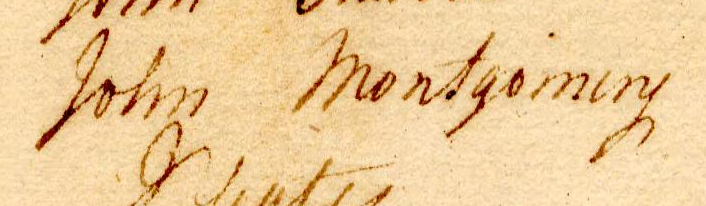John Montgomery
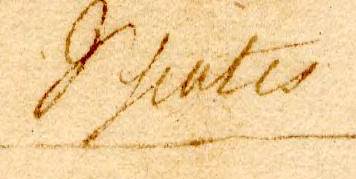J Yeates
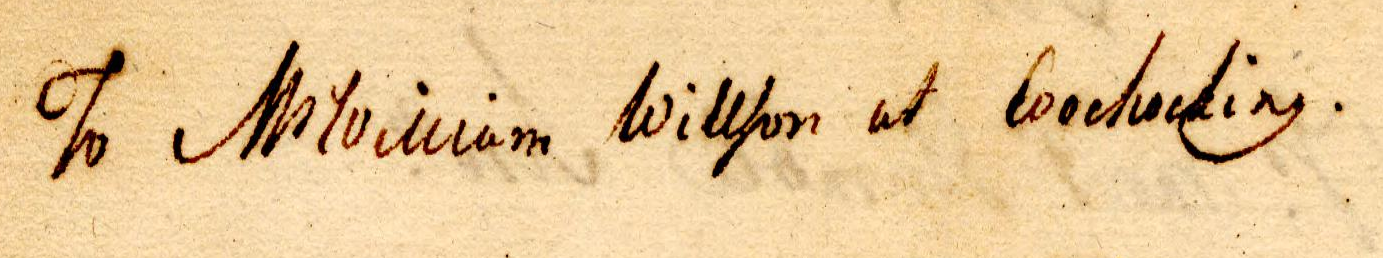To M^r William Wilson at Coochocking.
